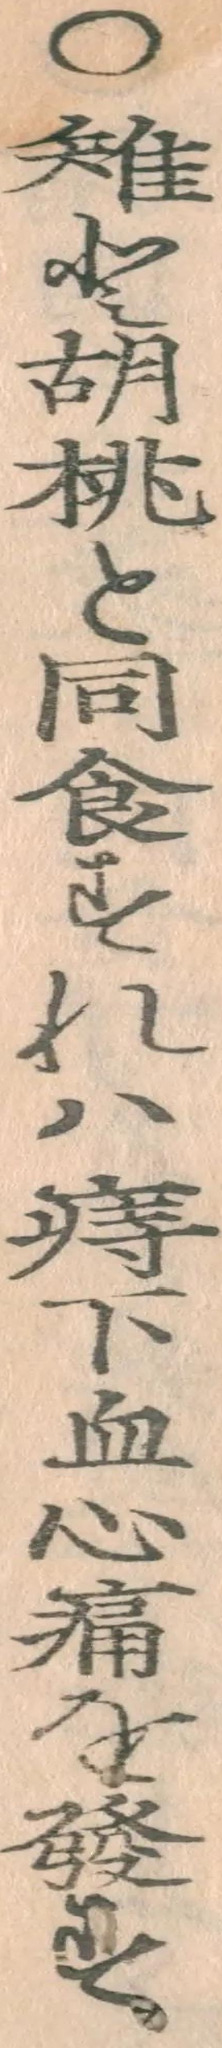〇雉と胡桃と同食すれは痔下血心痛を発す
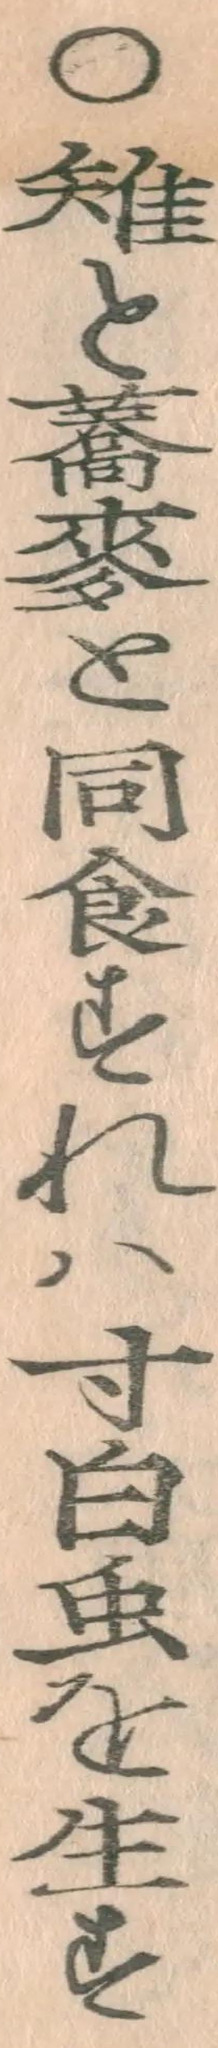〇雉と蕎麦と同食すれは寸白虫を生す
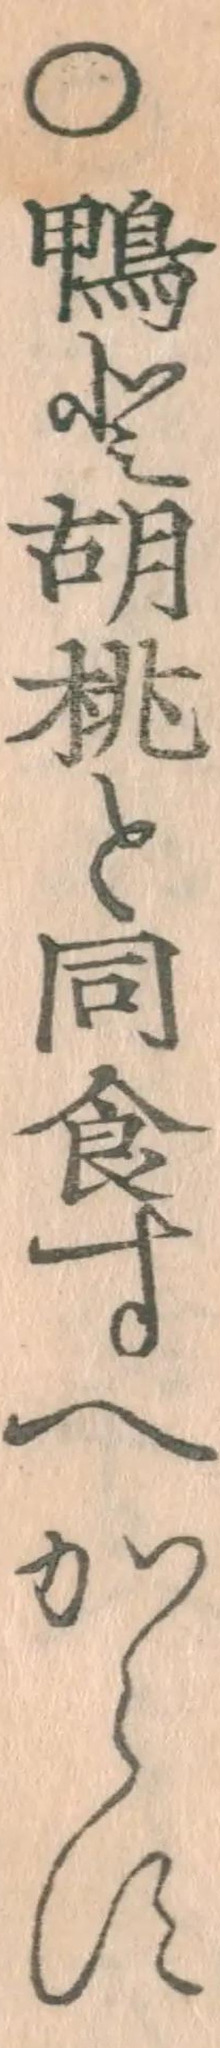〇鴨と胡桃と同食すへからす
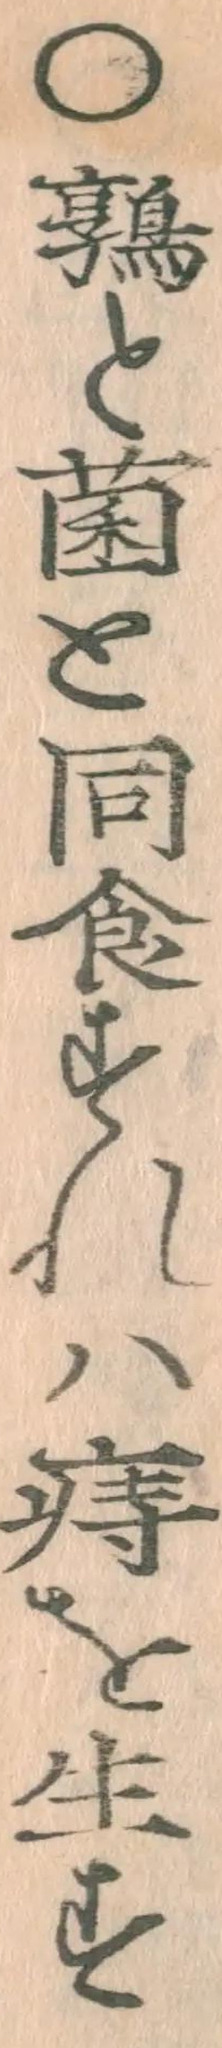〇鶉と菌と同食すれは痔を生す
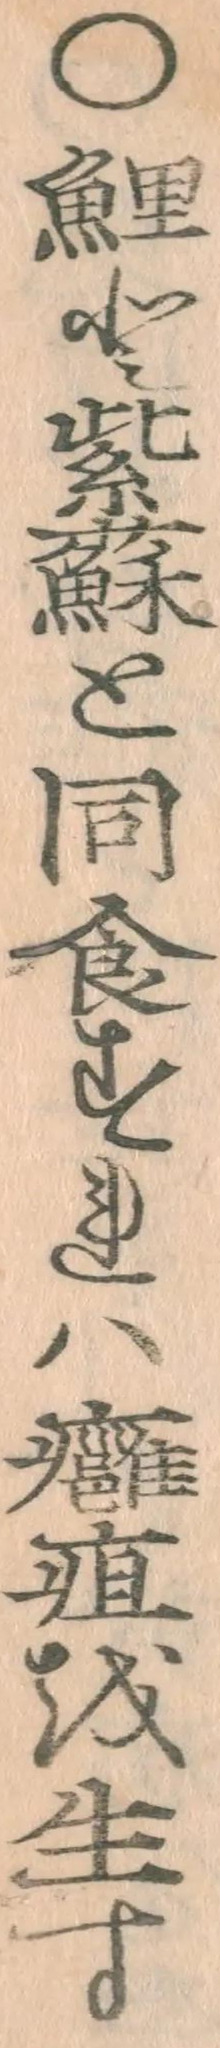〇鯉と紫蘇と同食すれは癰疽を生す
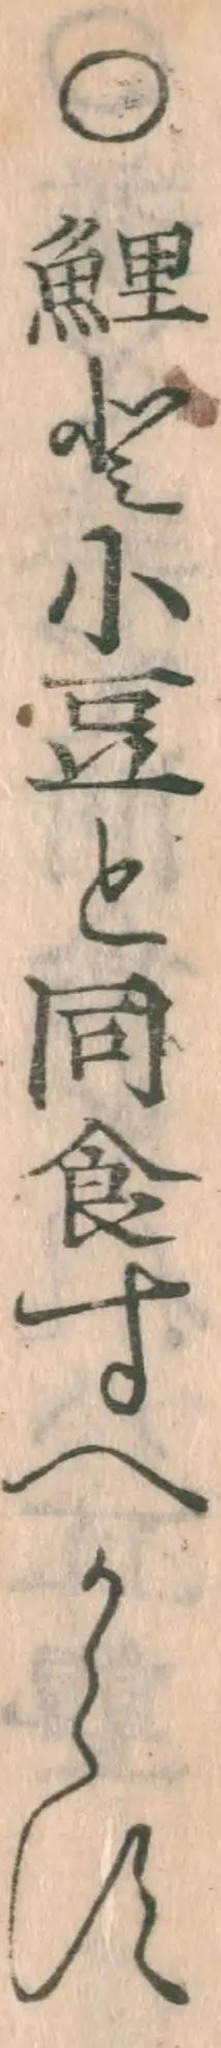〇鯉と小豆と同食すへからす
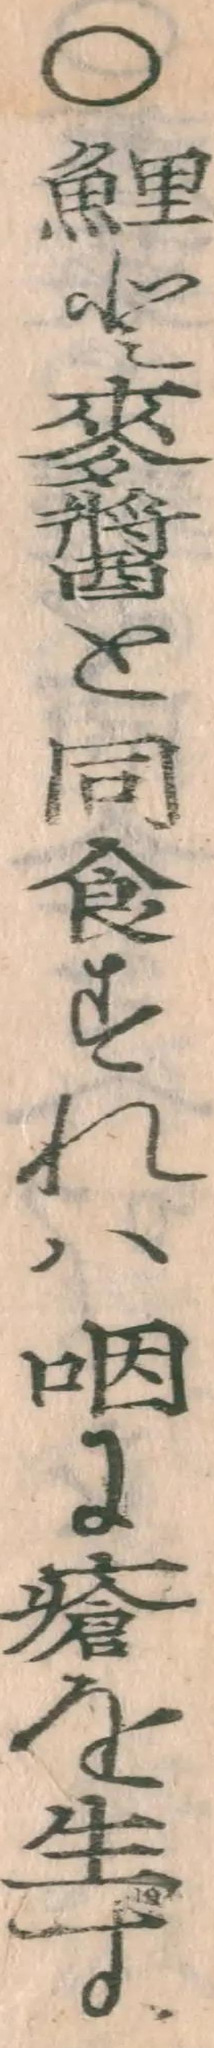〇鯉と麦醬と同食すれは咽に瘡を生す
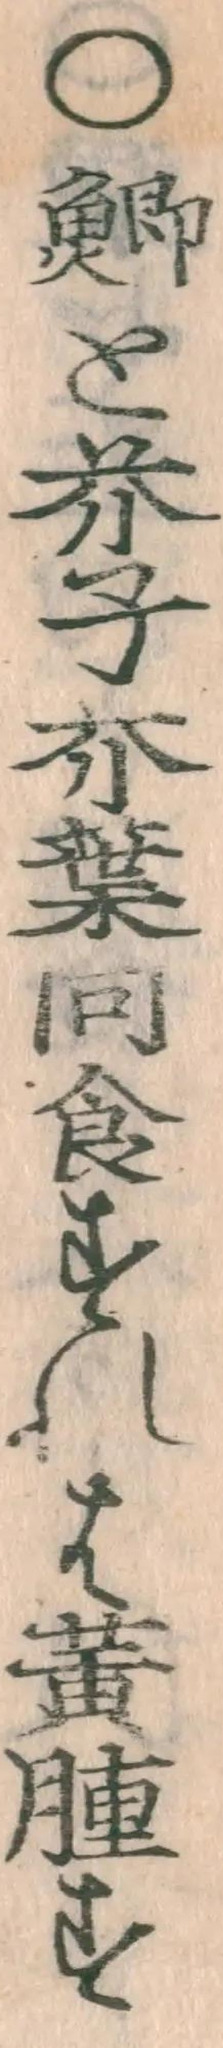〇鯽と芥子芥葉同食すれは黄腫す
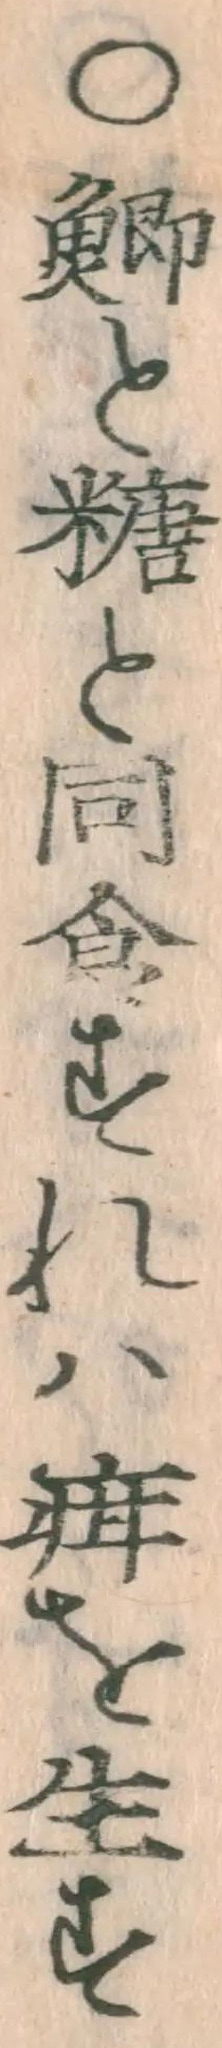〇鯽と糖と同食すれは疳を生す
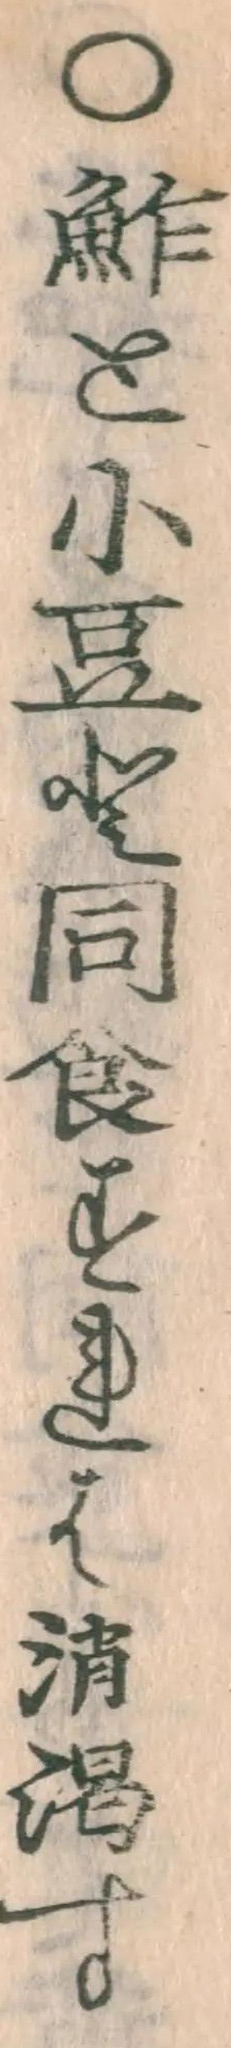〇鮓と小豆と同食すれは消渇す
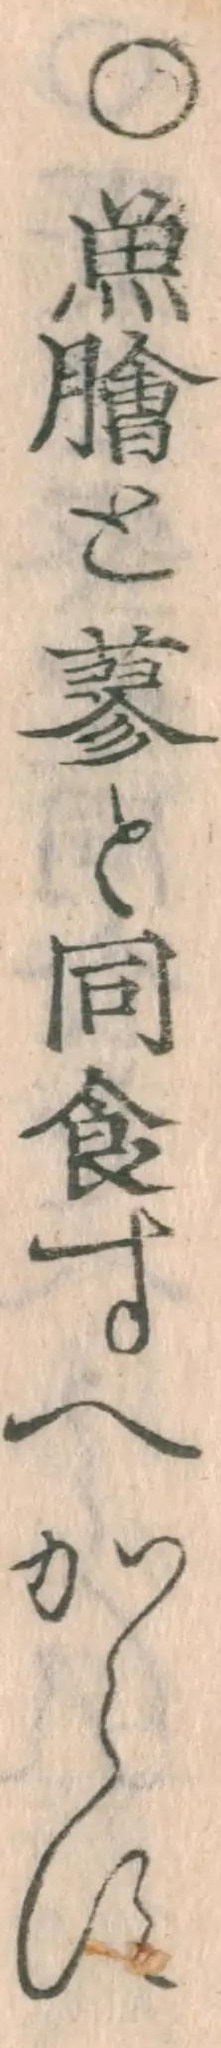〇魚膾と蓼と同食すへからす
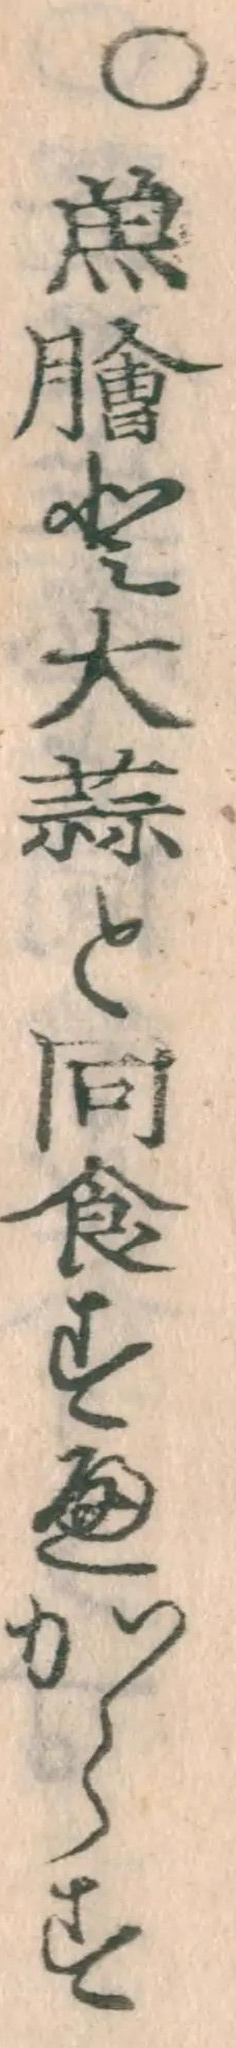〇魚膾と大蒜と同食すへからす
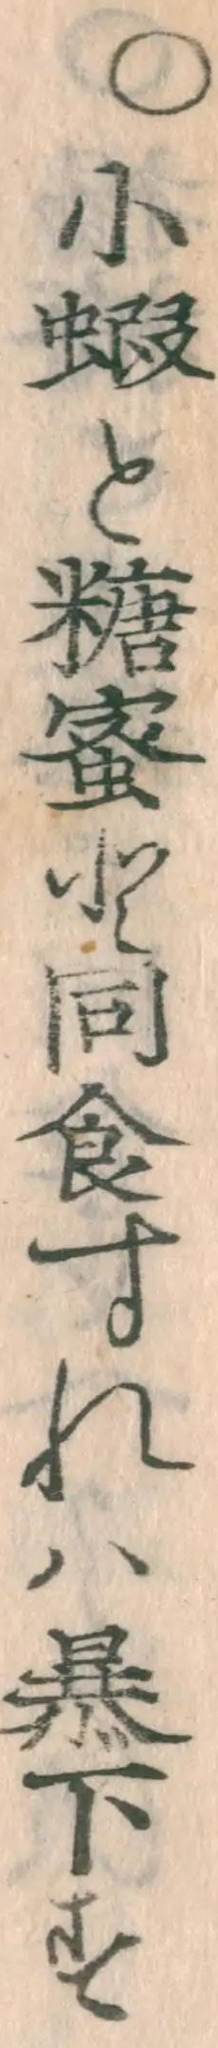〇小蝦と糖蜜と同食すれは暴下す
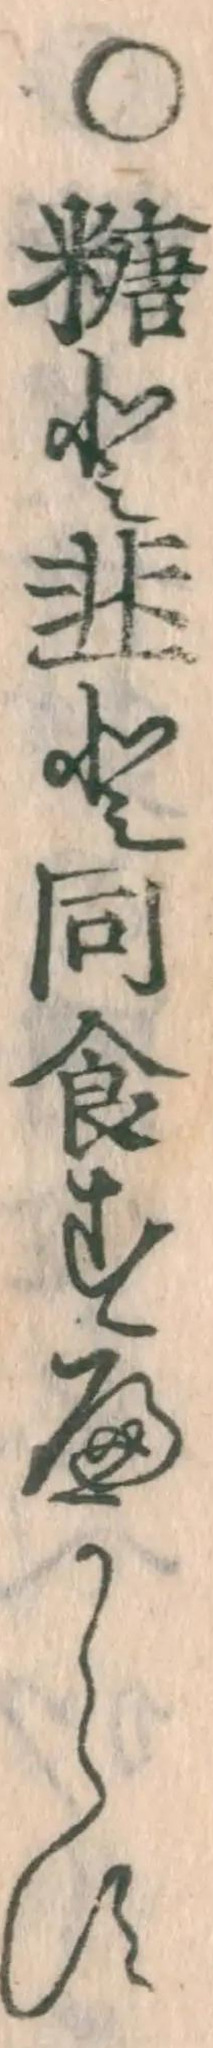〇糖と韮と同食すへからす

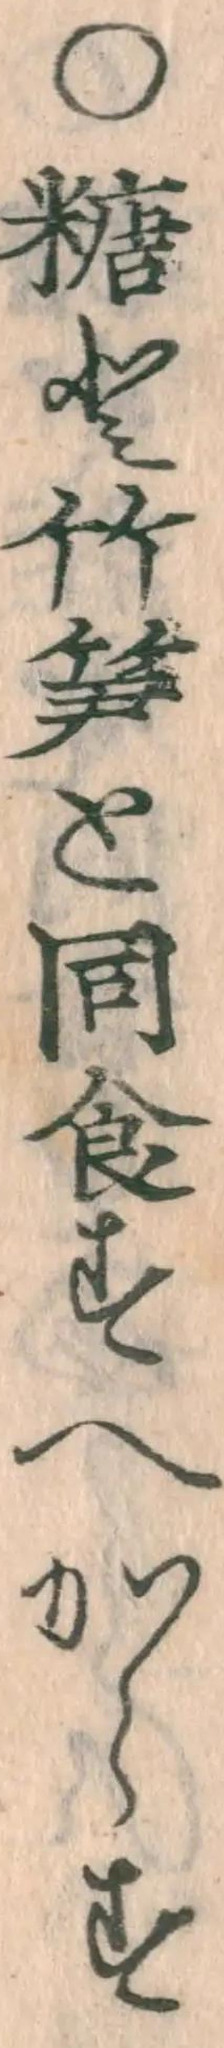〇糖と竹筍と同食すへからす
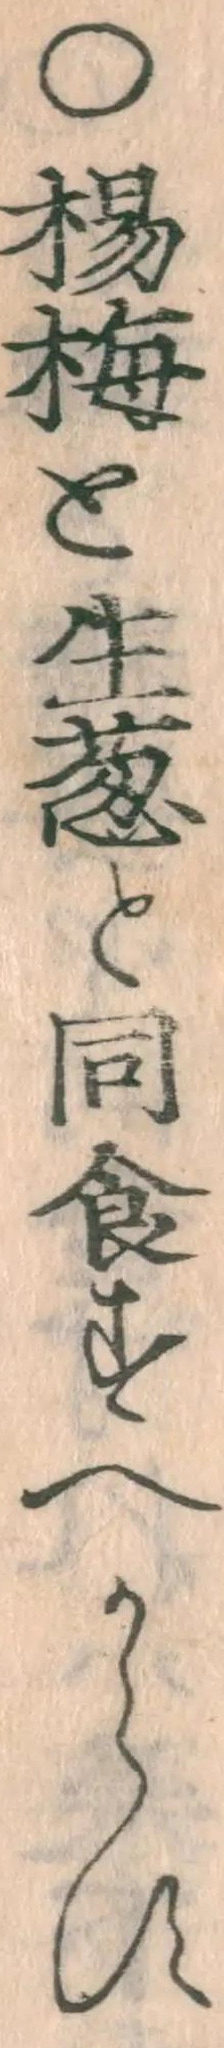〇楊梅と生葱と同食すへからす
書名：延壽撮要
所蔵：国立国会図書館 National Diet Library, JAPAN
